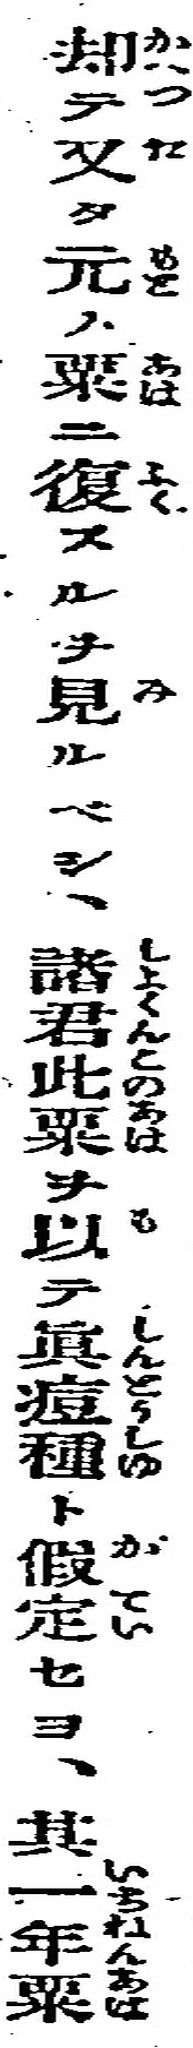却テ又タ元ノ粟ニ復スルヲ見ルベシ、諸君此粟ヲ以テ真痘種ト仮定セヨ、其一年粟
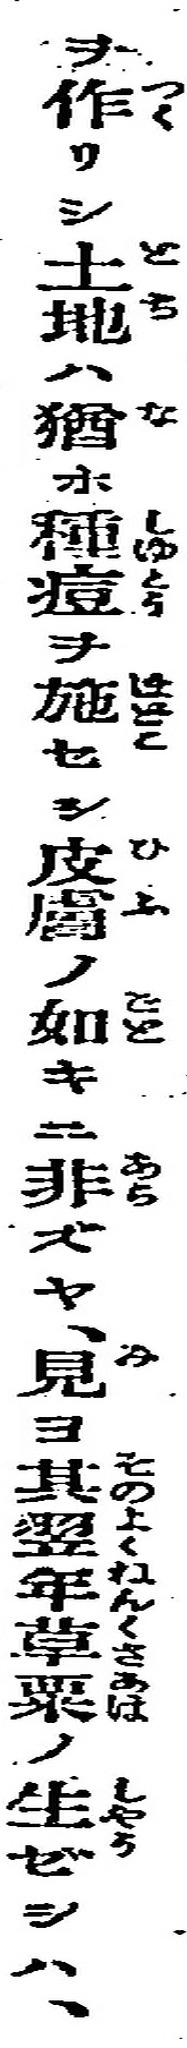ヲ作リシ土地ハ猶ホ種痘ヲ施セシ皮膚ノ如キニ非ズヤ、見ヨ其翌年草粟ノ生ゼシハ、
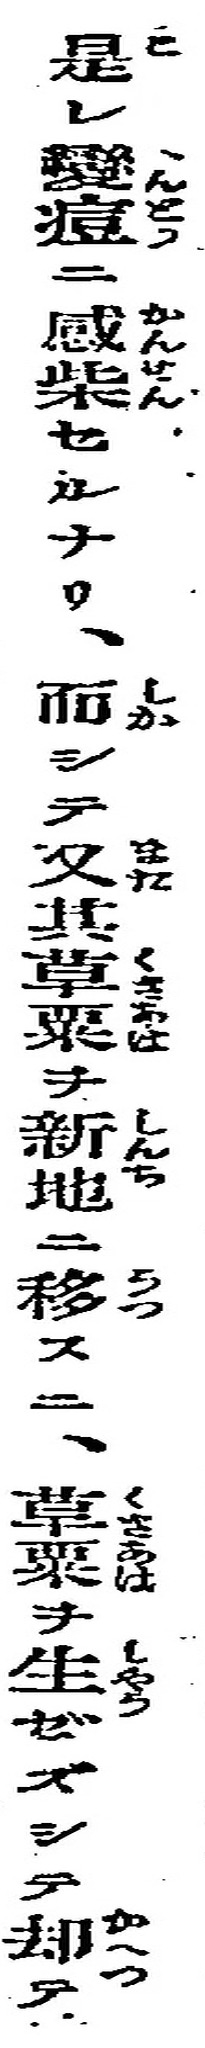是レ変痘ニ感柴セルナリ、而シテ又其草粟ヲ新地ニ移スニ、草粟ヲ生ゼズシテ却テ
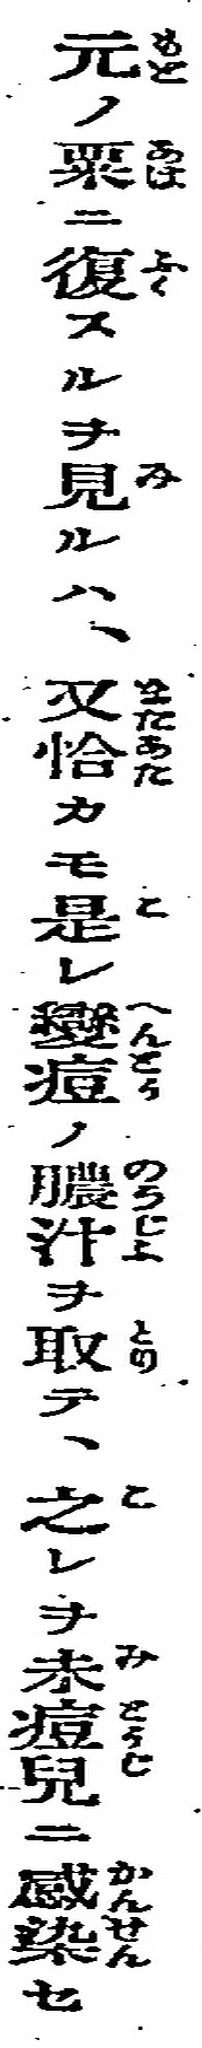元ノ粟ニ復スルヲ見ルハ、又恰カモ是レ変痘ノ膿汁ヲ取テ、之レヲ未痘児ニ感染セ
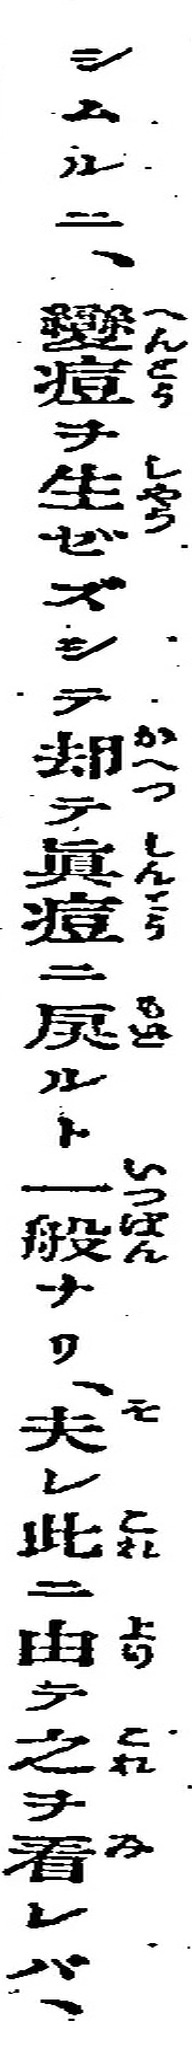シムルニ、変痘ヲ生ゼズシテ却テ真痘ニ戻ルト一般ナリ、夫レ此ニ由テ之ヲ看レバ、
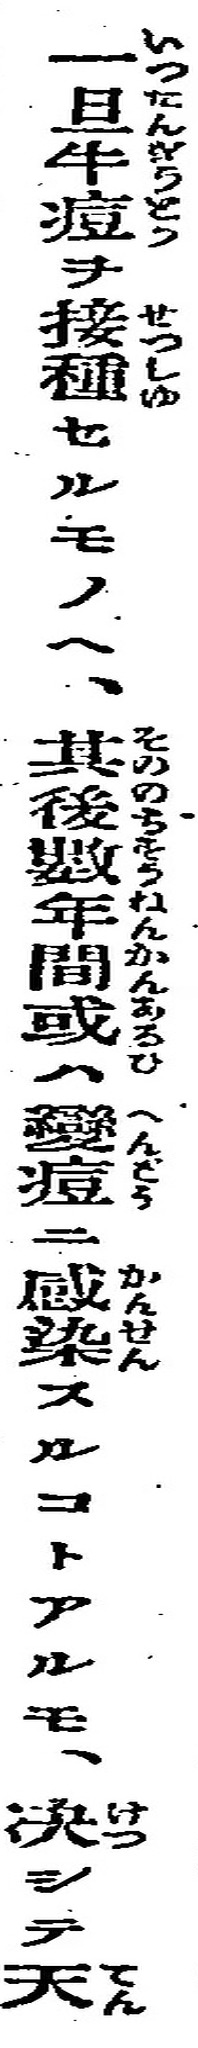一旦牛痘ヲ接種セルモノヘ、其後数年間或ハ変痘ニ感染スルコトアルモ、決シテ天
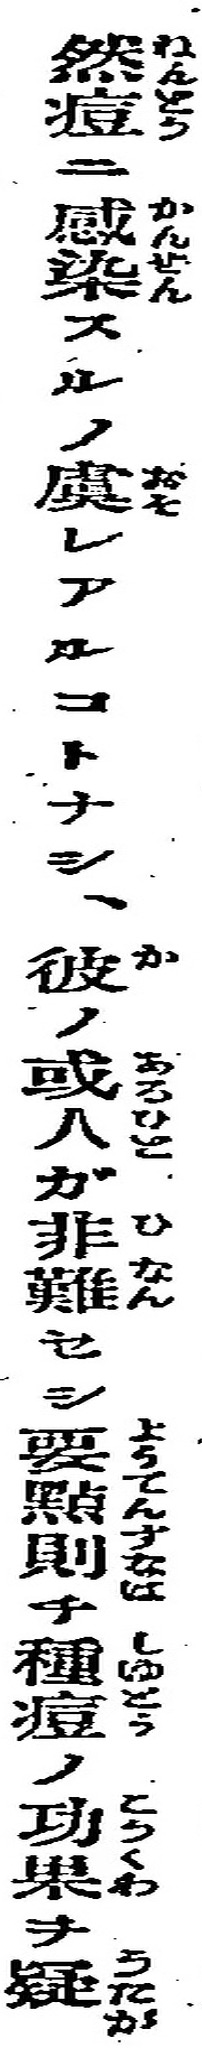然痘ニ感染スルノ虞レアルコトナシ、彼ノ或人ガ非難セシ要点則チ種痘ノ功果ヲ疑
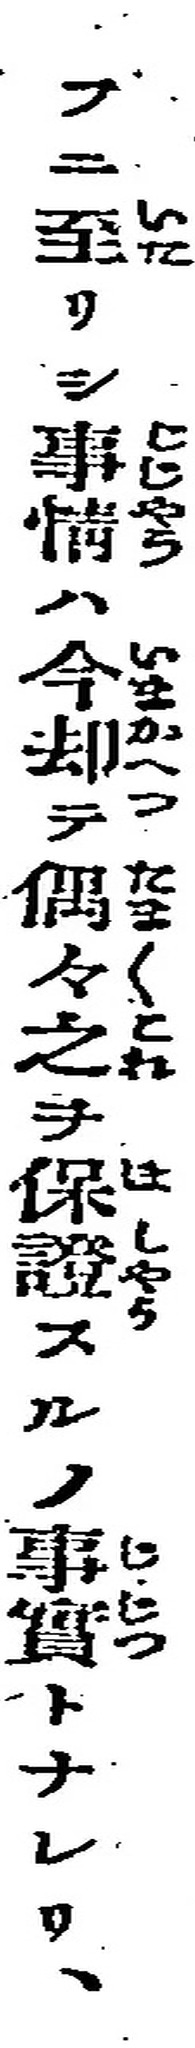フニ至リシ事情ハ今却テ偶々之ヲ保証スルノ事実トナレリ、
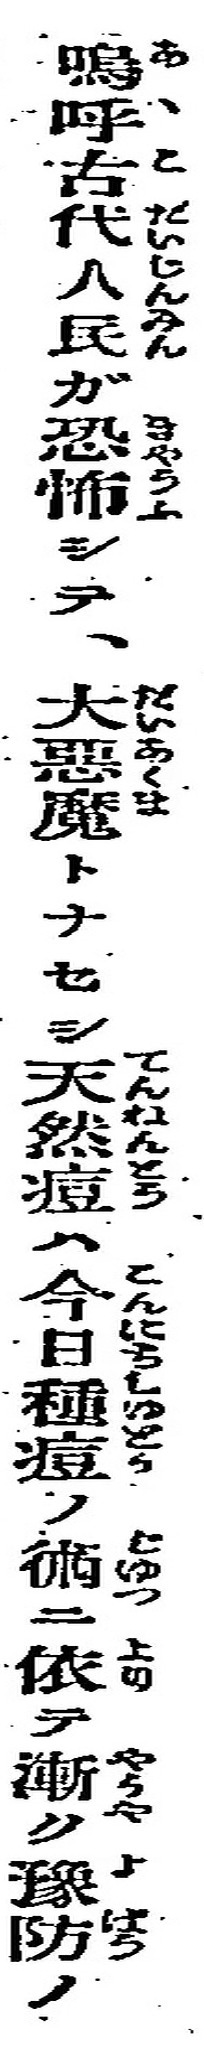嗚呼古代人民ガ恐怖シテ、大悪魔トナセシ天然痘ハ今日種痘ノ術ニ依テ漸ク予防ノ
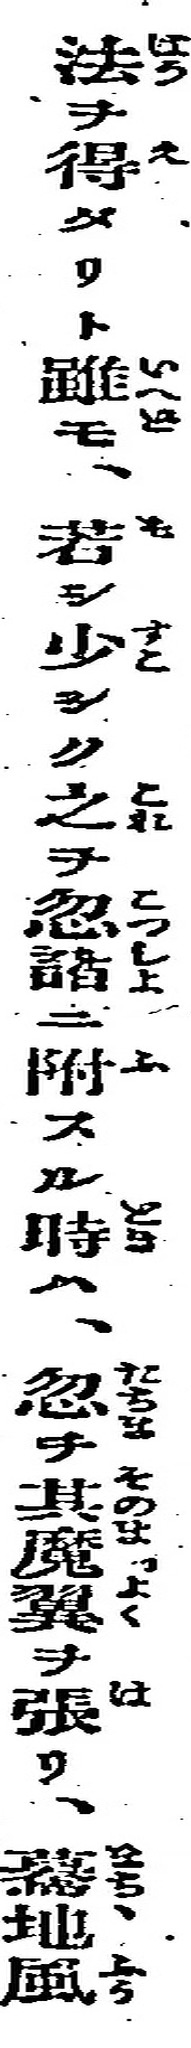法ヲ得タリト雖モ、若シ少シク之ヲ忽諸ニ附スル時ハ、忽チ其魔翼ヲ張リ、驀地風

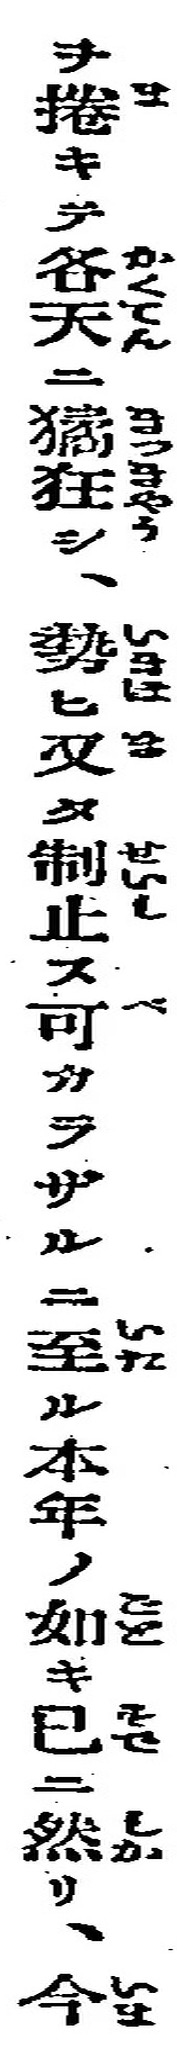ヲ捲キテ各天ニ獝狂シ、勢ヒ又タ制止ス可カラザルニ至ル本年ノ如キ已ニ然リ、今
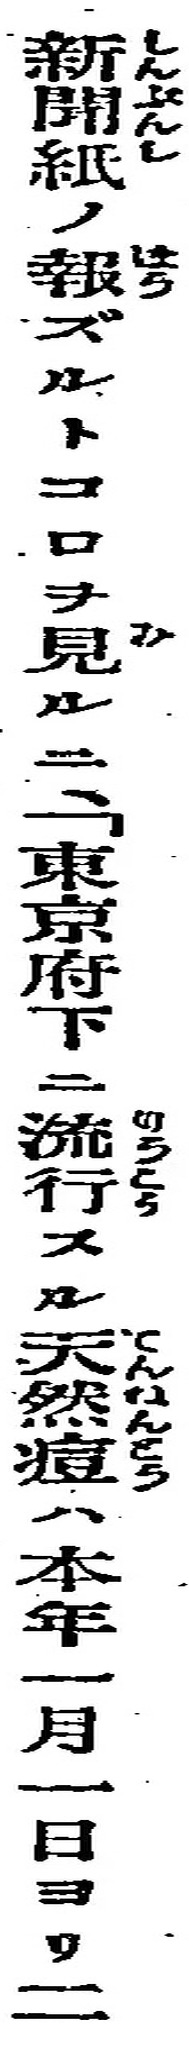新聞紙ノ報ズルトコロヲ見ルニ、「東京府下ニ流行スル天然痘ハ本年一月一日ヨリ二
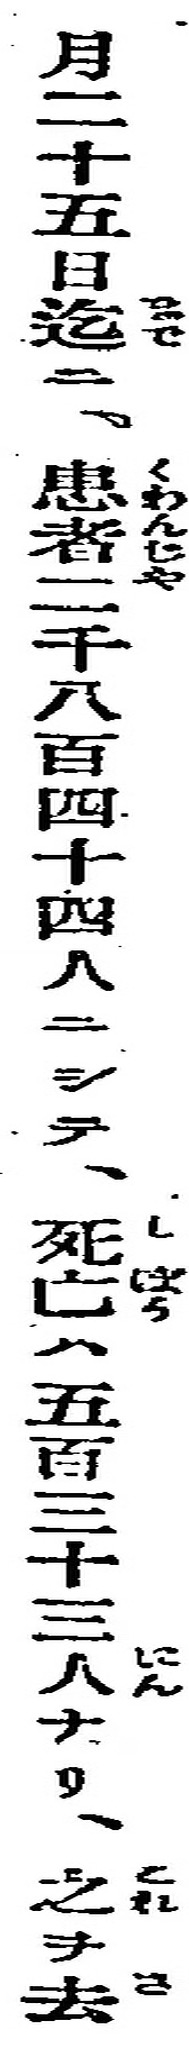月二十五日迄ニ、患者二千八百四十四人ニシテ、死亡ハ五百三十三人ナリ、之ヲ去
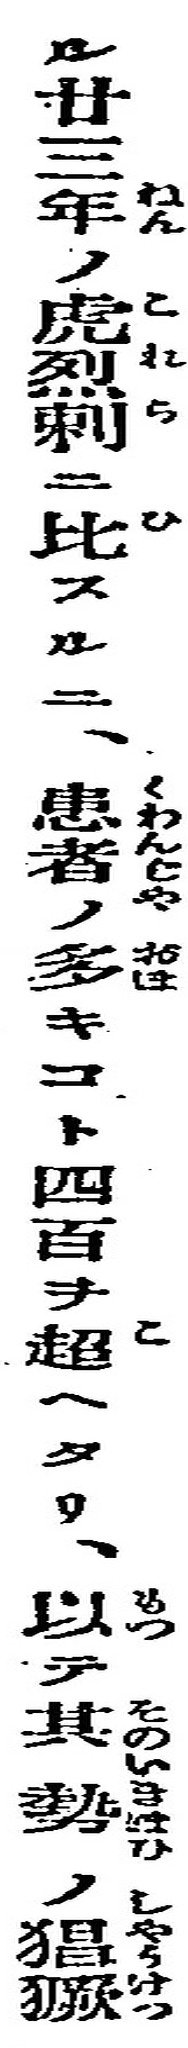ル廿三年ノ虎烈刺ニ比スルニ、患者ノ多キコト四百ヲ超ヘタリ、以テ其勢ノ猖獗
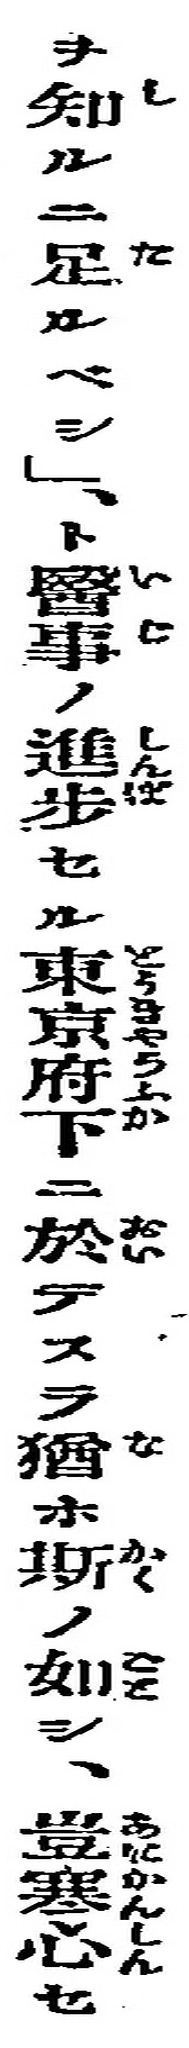ヲ知ルニ足ルベシ」、ト医事ノ進歩セル東京府下ニ於テスラ猶ホ斯ノ如シ、豈寒心セ
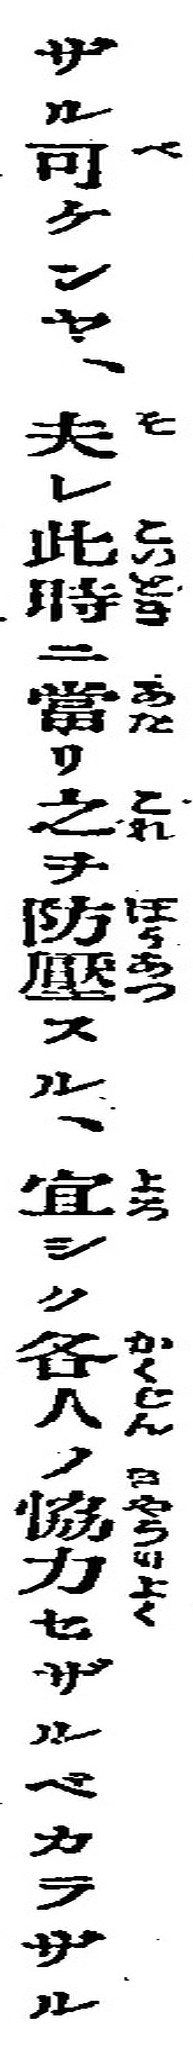ザル可ケンヤ、夫レ此時ニ当リ之ヲ防圧スル、宜シク各人ノ恊力セザルベカラザル
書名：天然痘予防注意兼種痘者之注意
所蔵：国立国会図書館 National Diet Library, JAPAN
